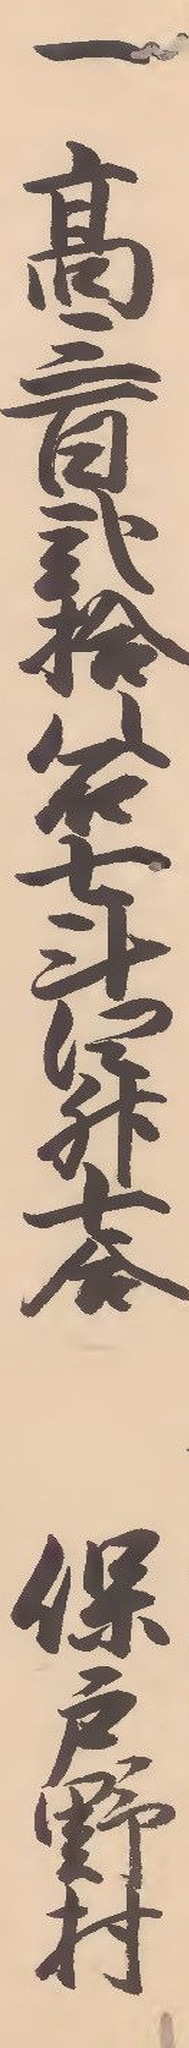一高三百弐拾八石七斗四升七合保戸野村
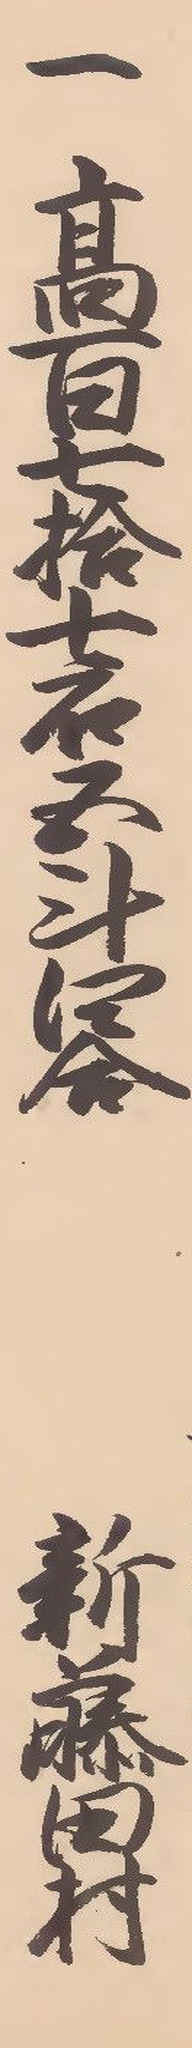一高百七拾七石五斗四合新藤田村
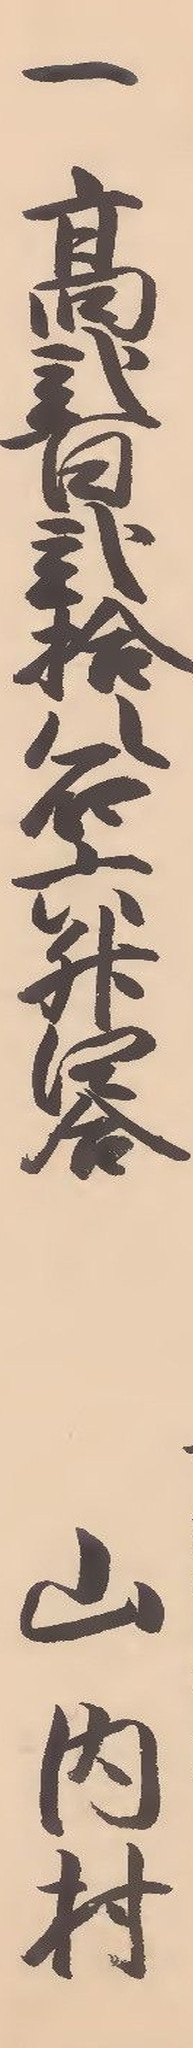一高弐百弐拾八石六升四合山内村
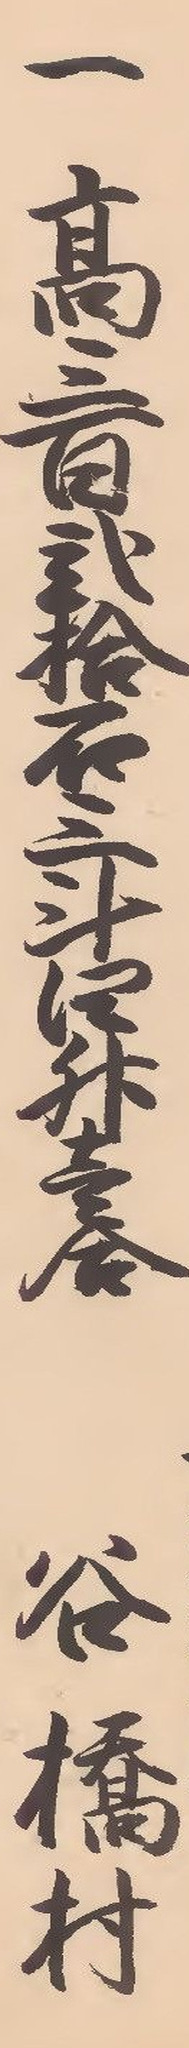一高三百弐拾石三斗四升壱合谷橋村
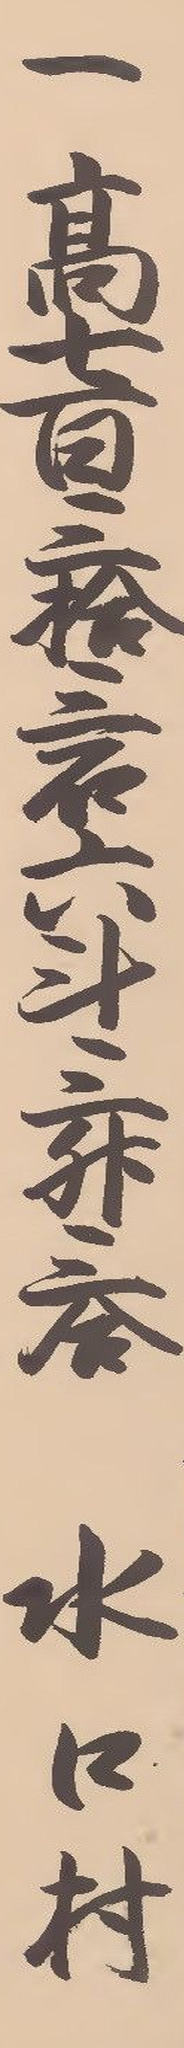一高七百三拾三石六斗三升三合水口村
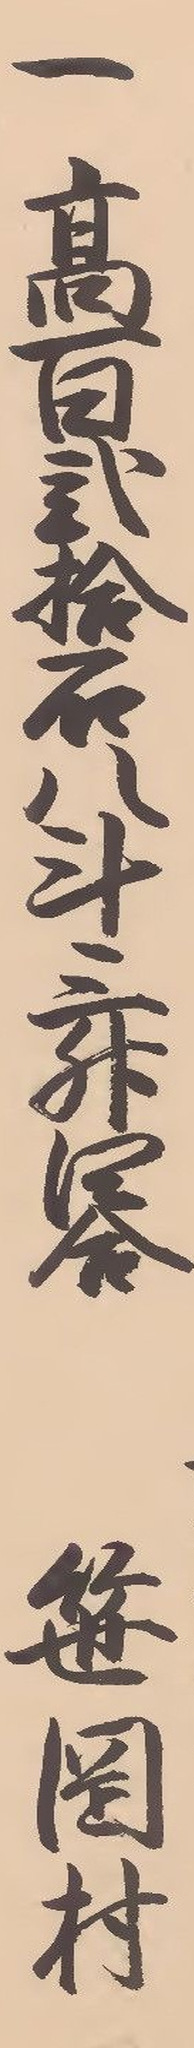一高百弐拾石八斗三升四合笹岡村
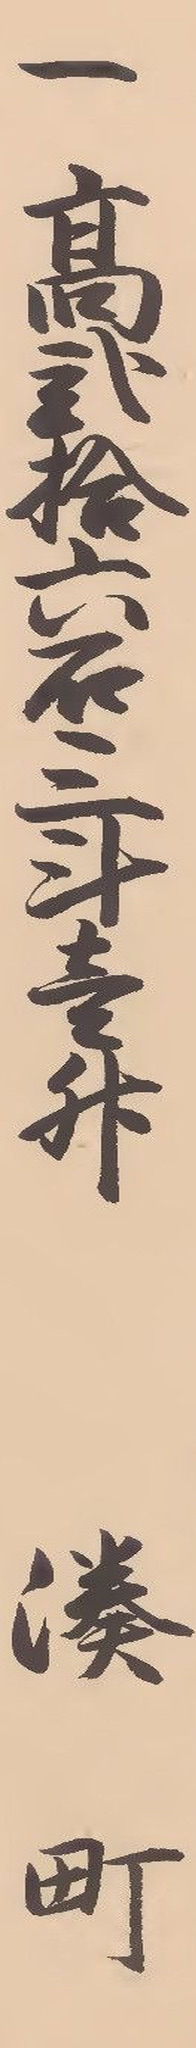一高弐拾六石三斗壱升湊町
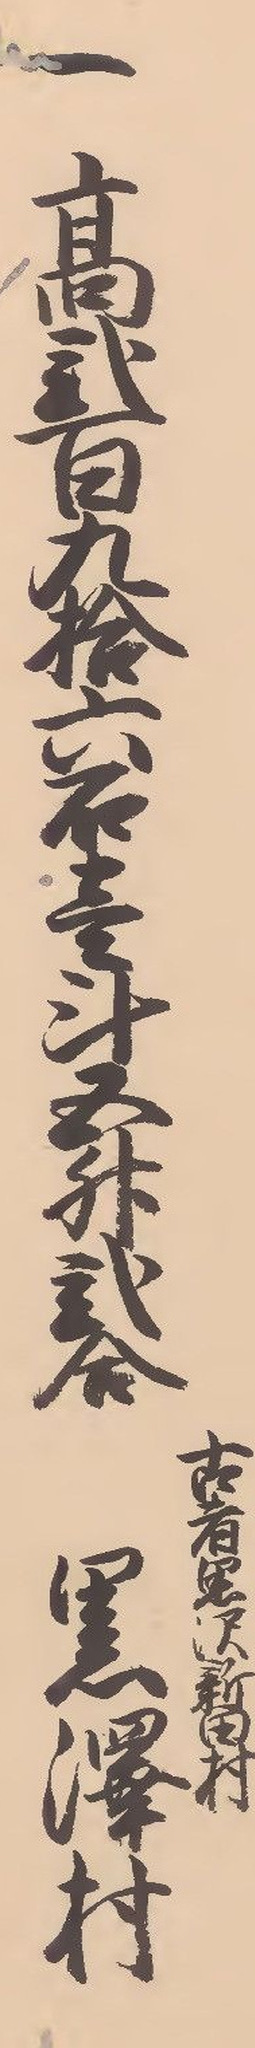一高弐百九拾六石壱斗五升弐合黒沢村

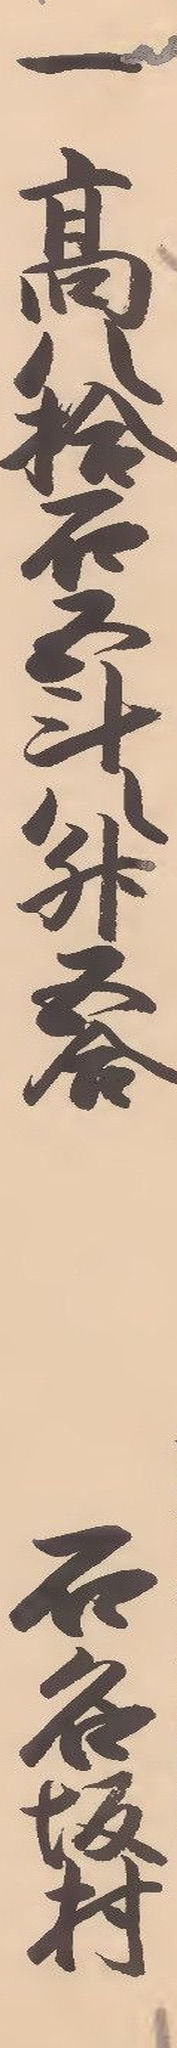一高八拾石五斗八升五合石名坂村
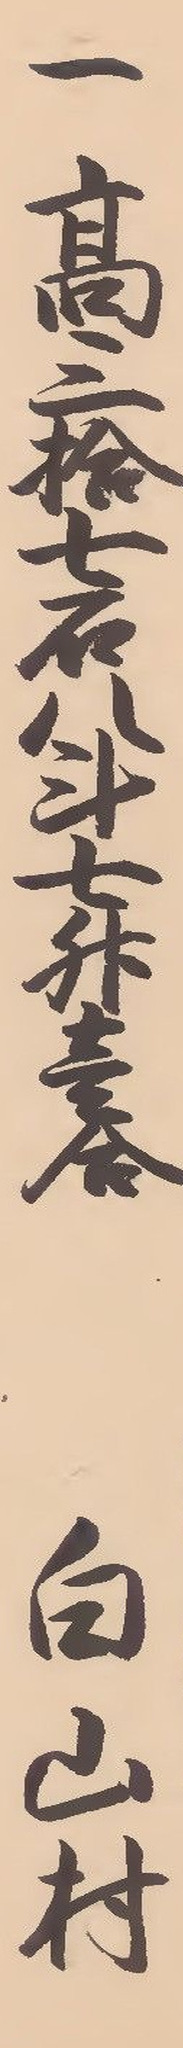一高三拾七石八斗七升壱合白山村
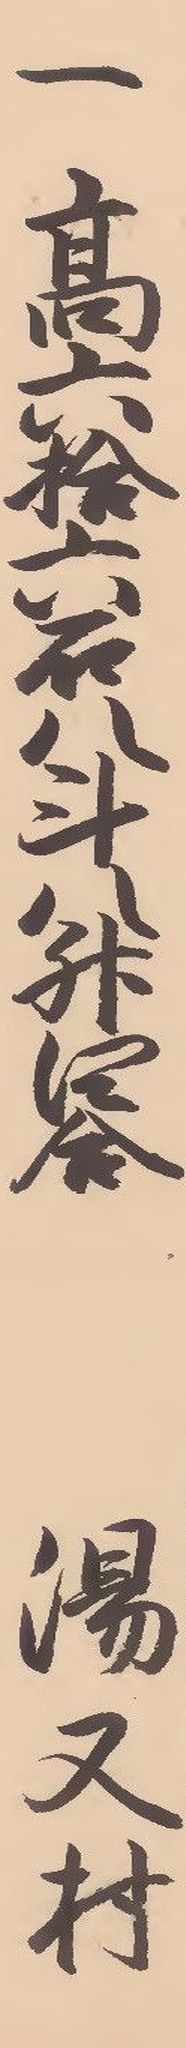一高六拾六石八斗八升四合湯又村
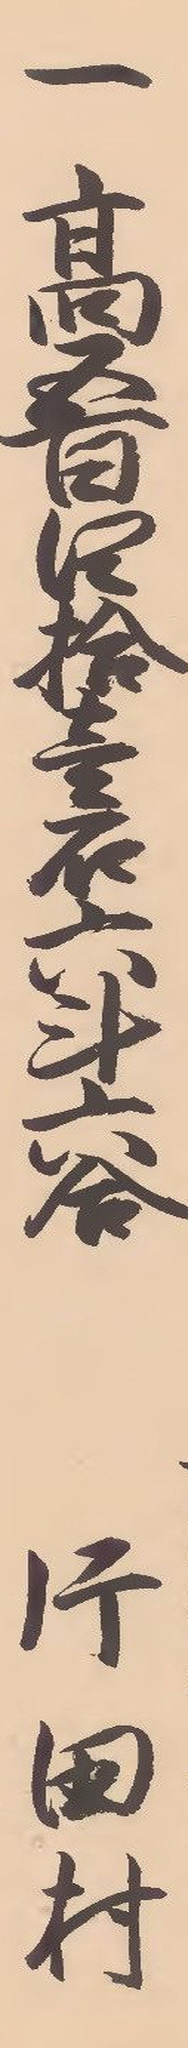一高五百四拾壱石六斗六合片田村
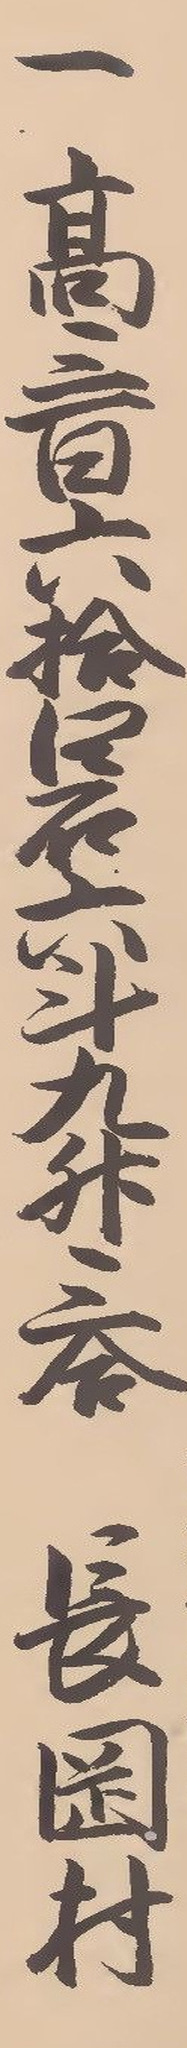一高三百六拾四石六斗九升三合長岡村
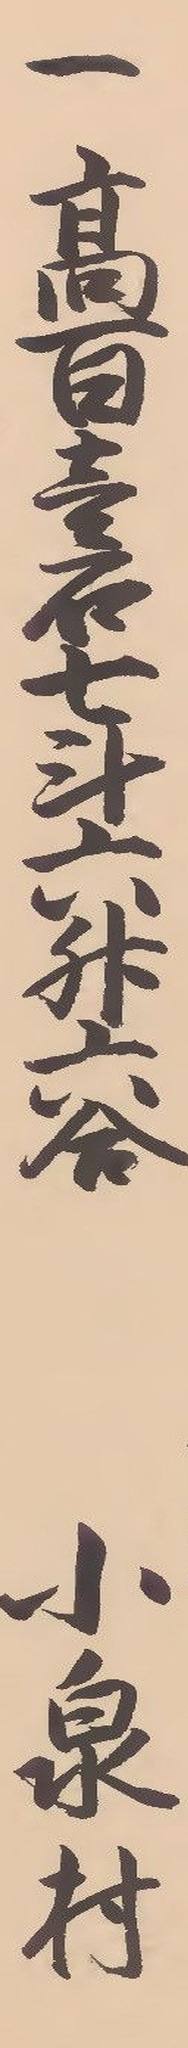一高百壱石七斗六升六合小泉村
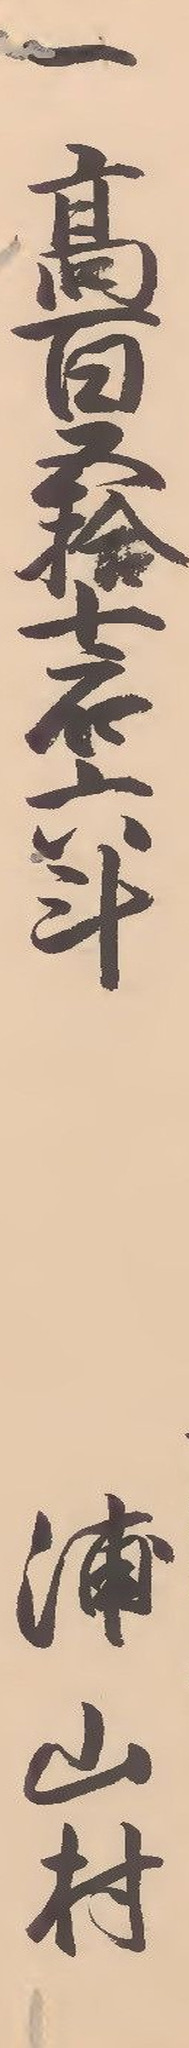一高百五拾七石六斗浦山村

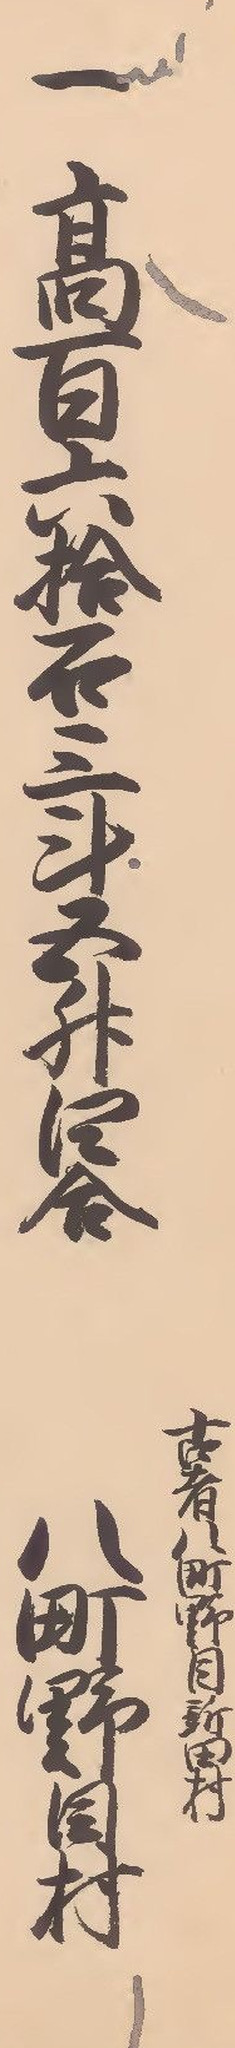一高百六拾石三斗五升四合八町野目村
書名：出羽国郷帳　５
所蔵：国立公文書館 National Archives of Japan
